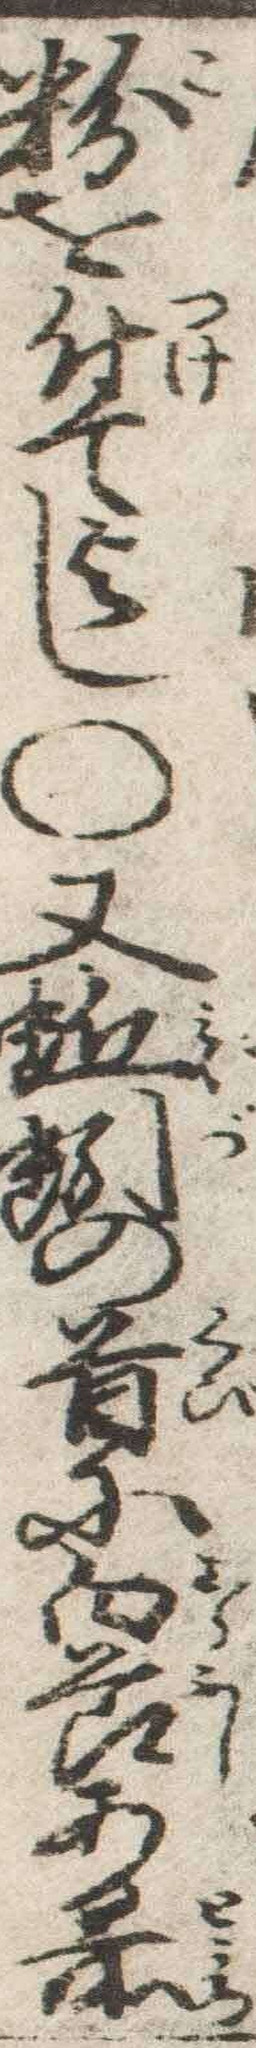粉を付てよし○又蚯蚓の首に白節ある所
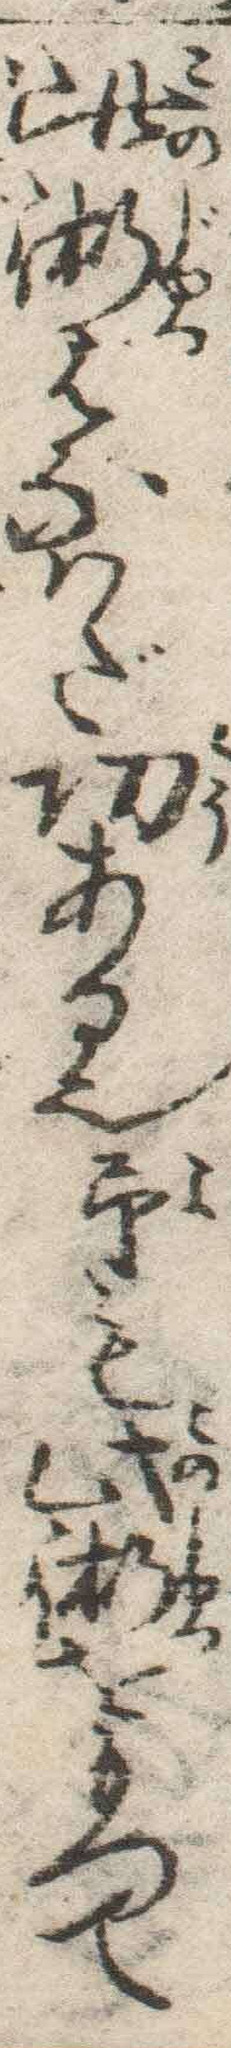此術はなはだ功ある也予も此術をもつて
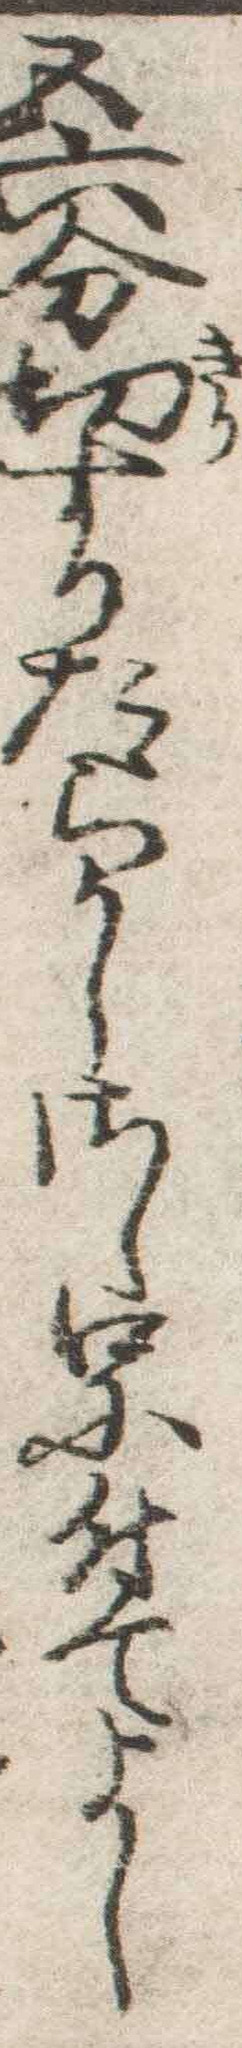五六分切すりたゝらかしさし口に付てよし
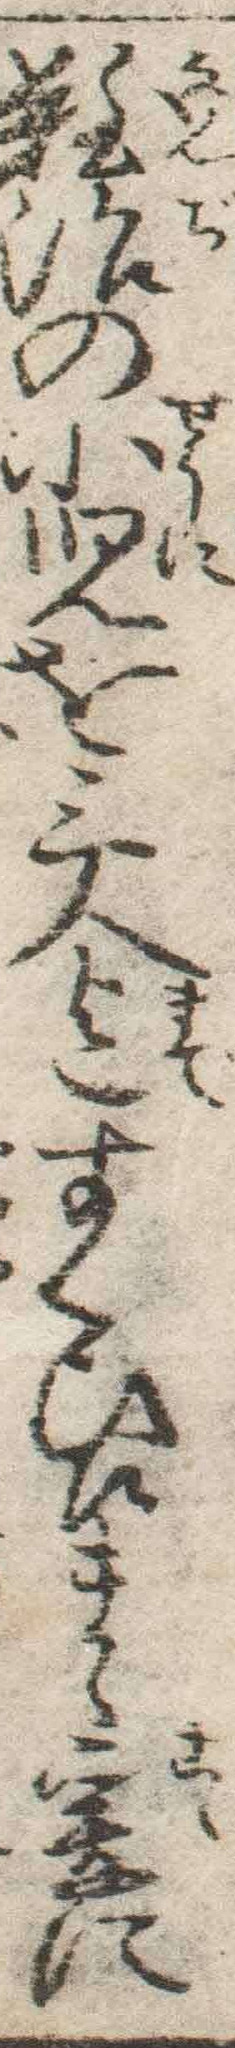難治の小児を三人迄すくひ候また爰に
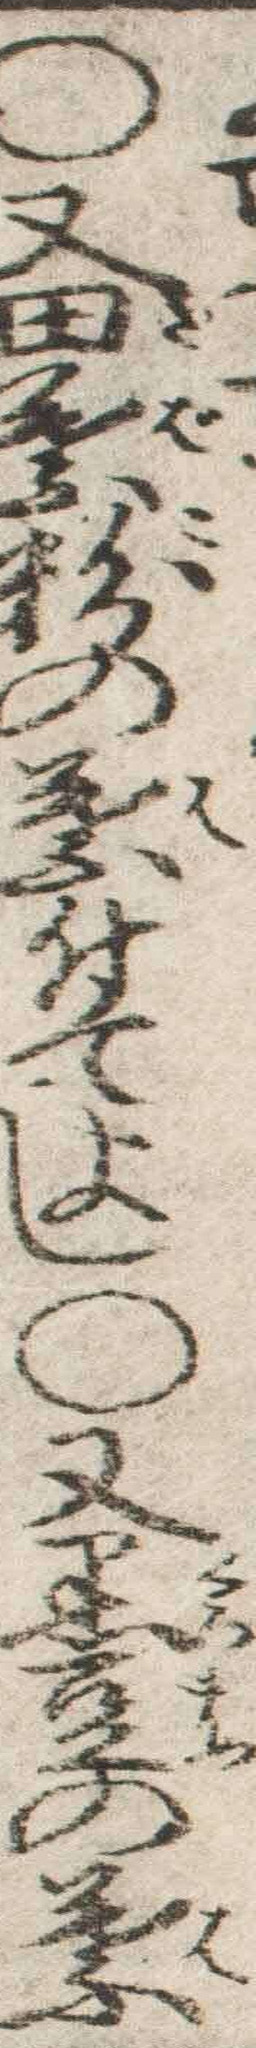○又田葉粉の葉付てよし○又黒豆の葉
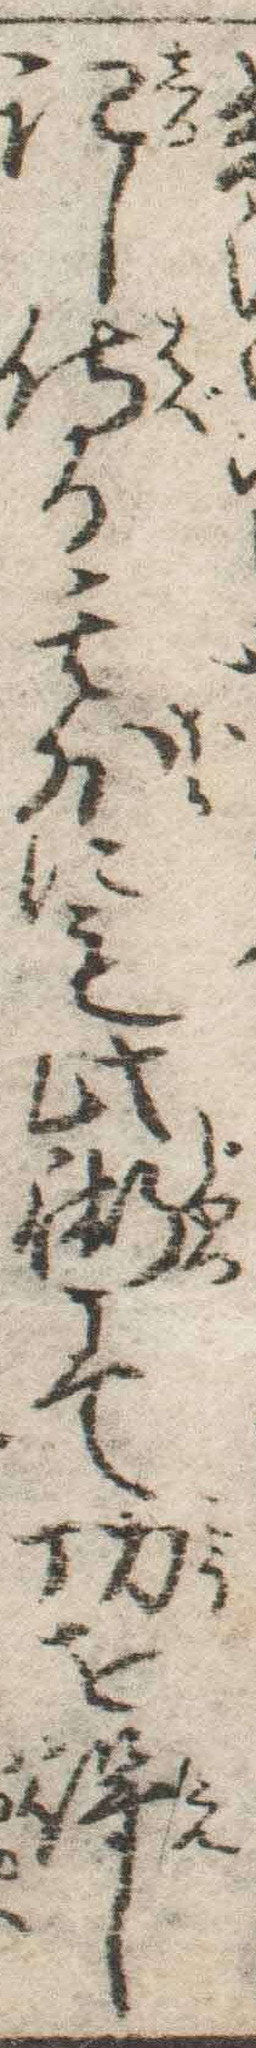記し侍り其外にも此術にて功を得し
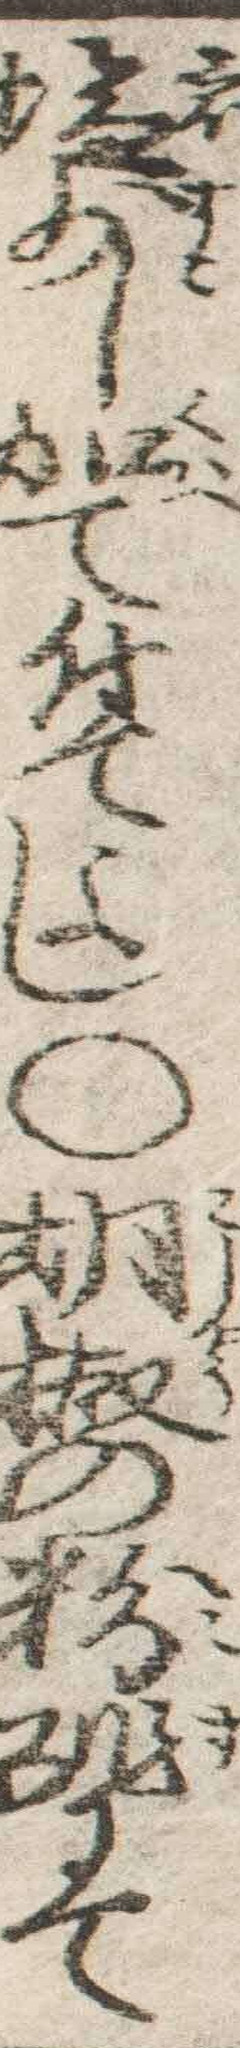塩少し加て付てよし○胡椒の粉酢にて
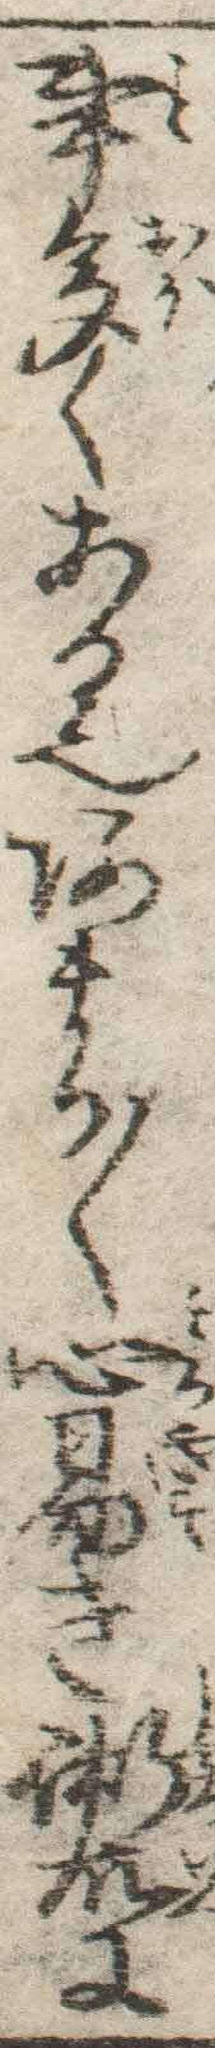事多くある也あまり〳〵心易き術故に
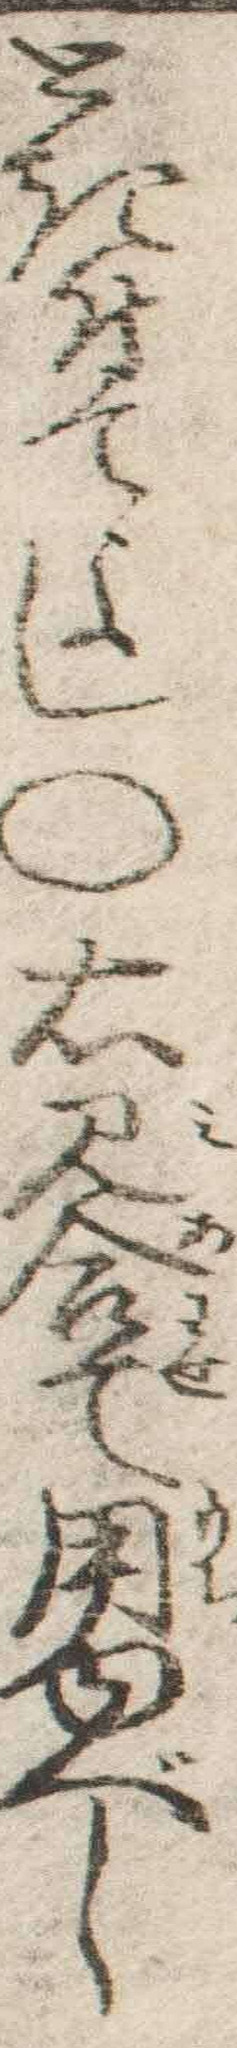とき付てよし○右見合て用ゆべし
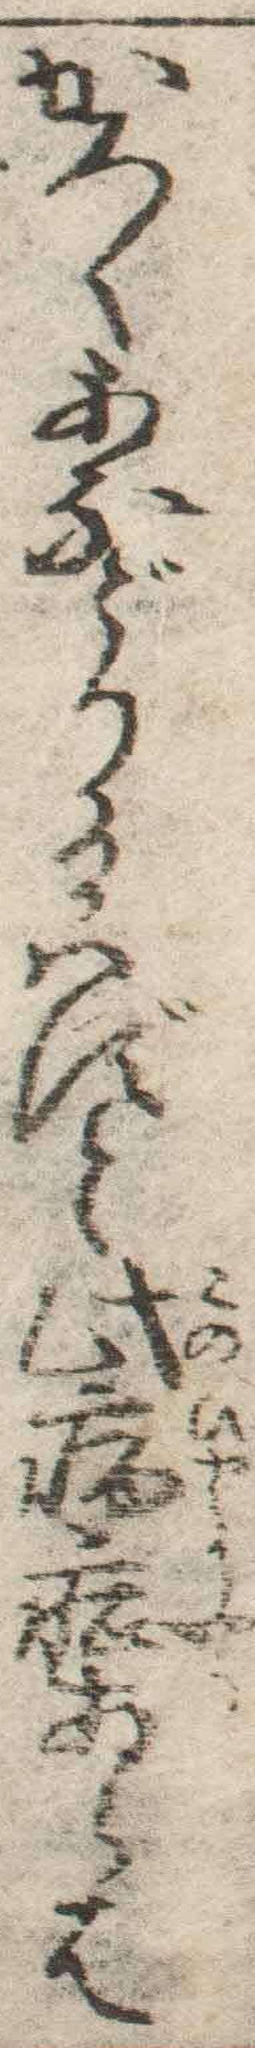かろくあなどり給はずと此病症あらは
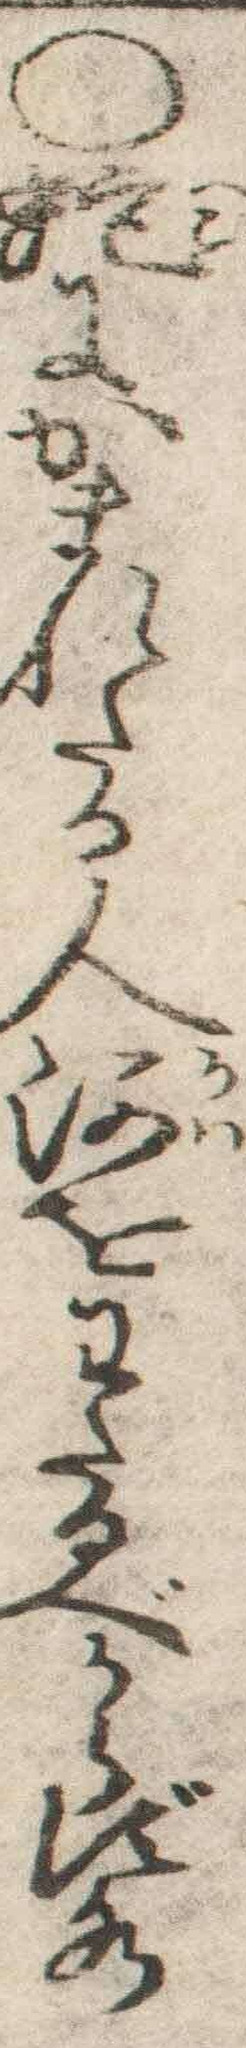○蛇にかまれたる人河をわたるべからず水
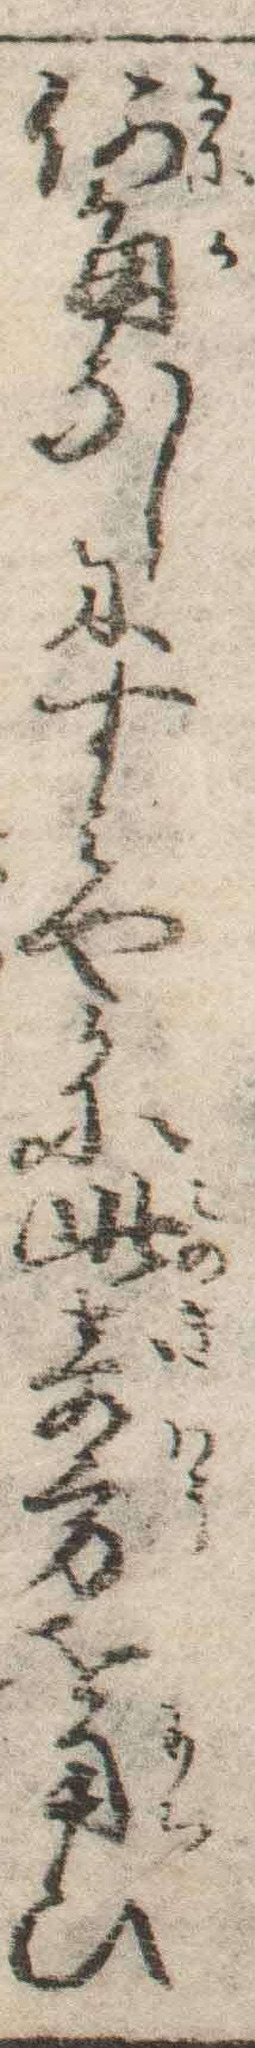何角なしにすみやかに此奇方を用ひ
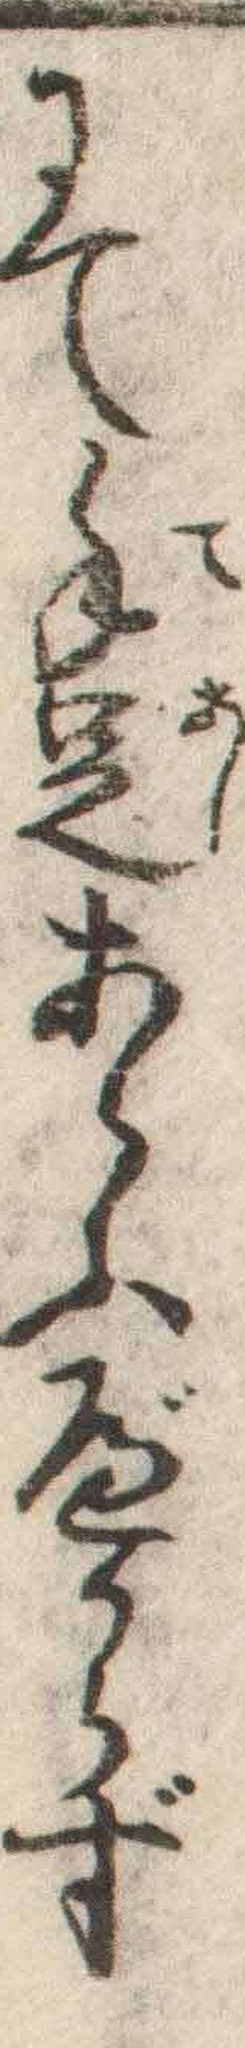にて手足あらふべからず
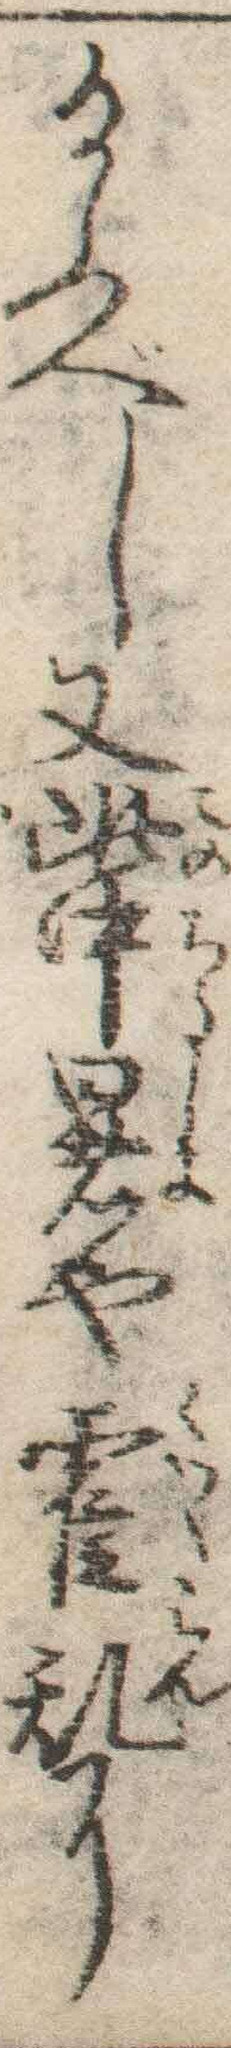給ふべし又此中暑や霍乱に

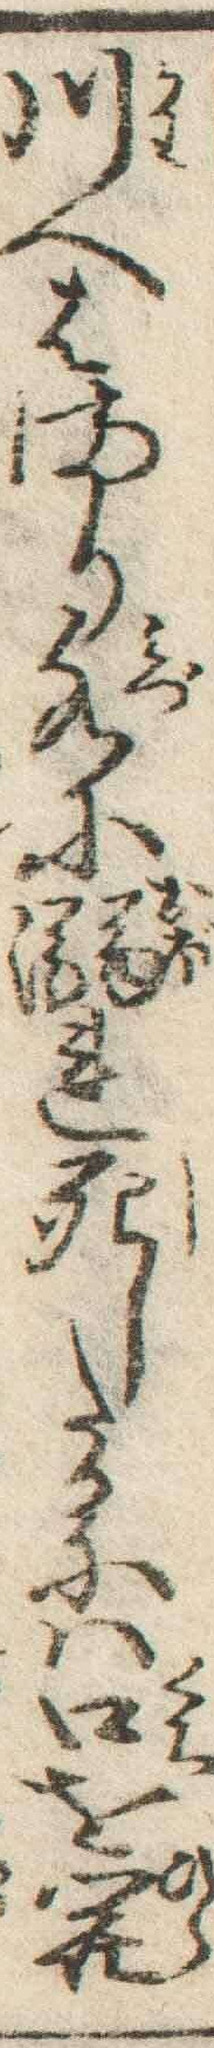川へはまり水に溺れ死したるには口を開
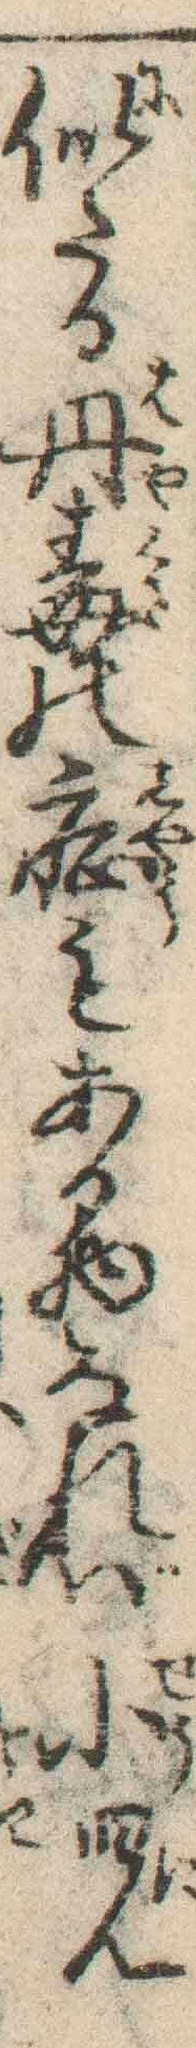似たる丹毒の症もある物なれば小児
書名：撫育草
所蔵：東京学芸大学附属図書館 国文学研究資料館
